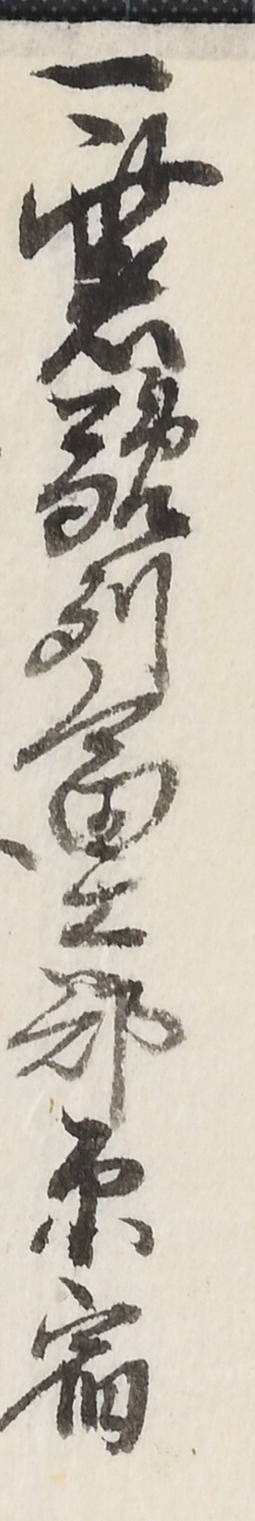一此者駿州富士郡原宿
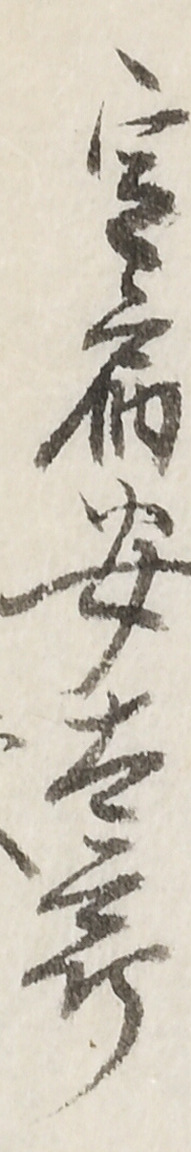定宿安太郎
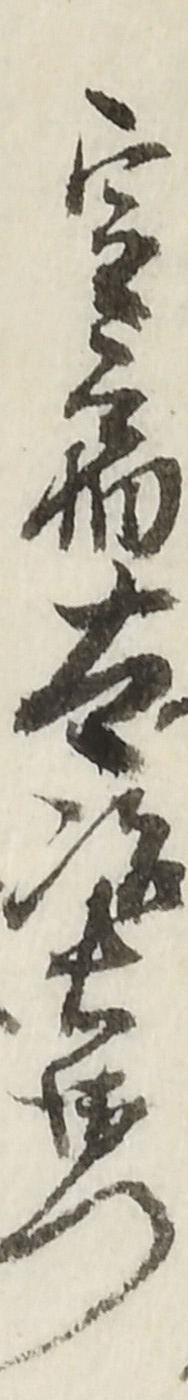定宿太治右衛門

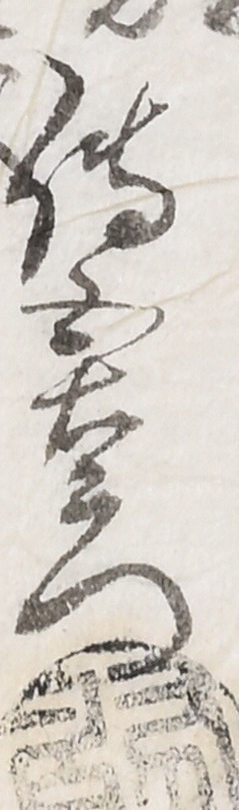宿藤右衛門
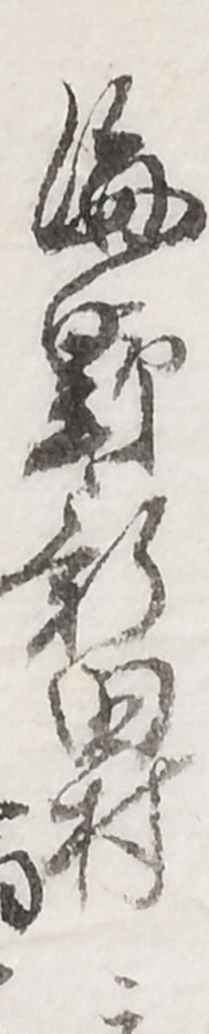海野新田村
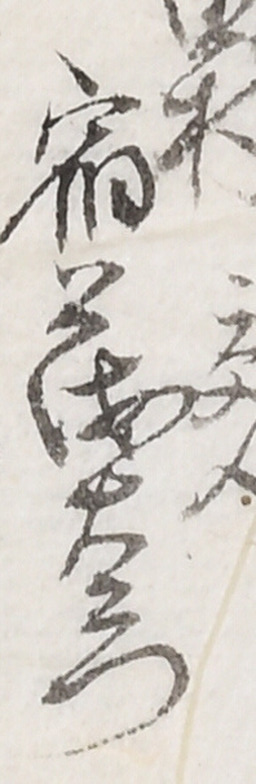宿藤右衛門
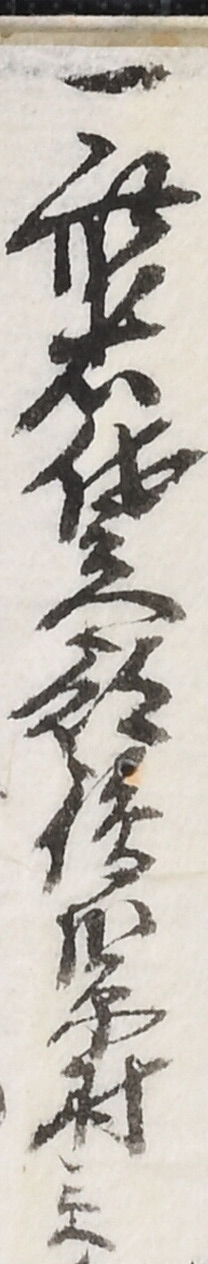一此者佐久郡島川原村
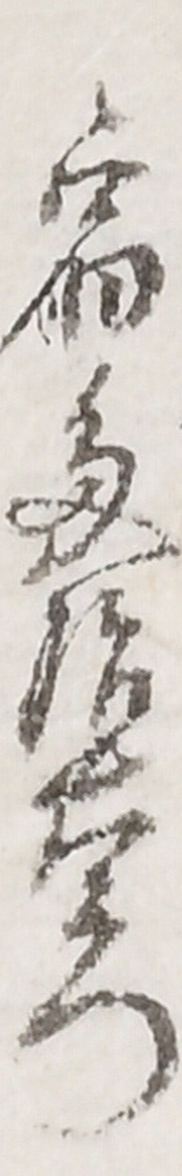宿多治右衛門
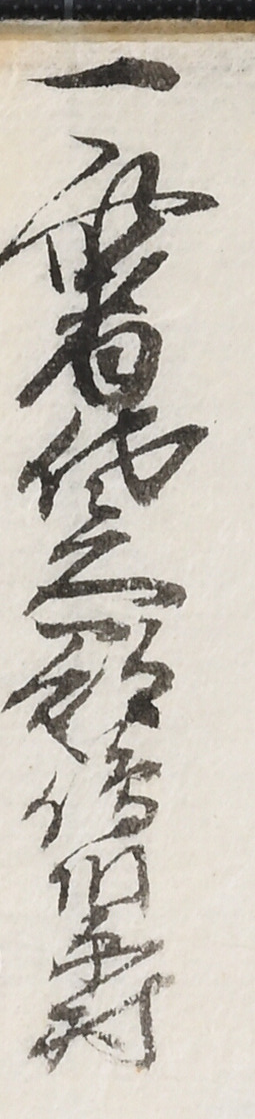一此者佐久郡島川原村
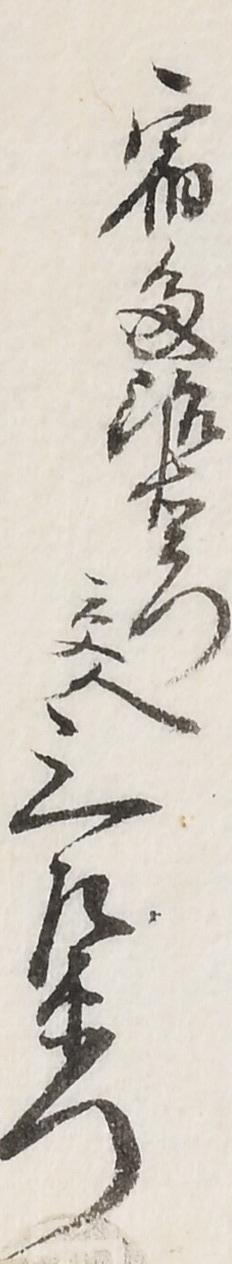宿多治右衛門
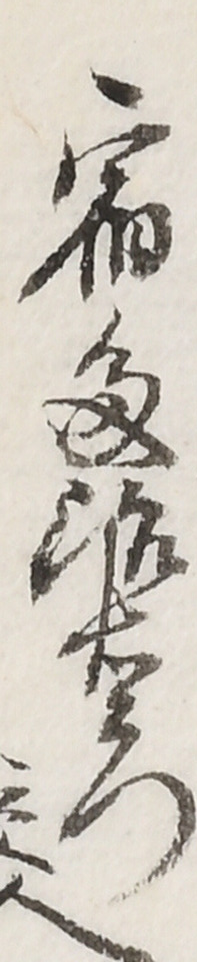宿多治右衛門
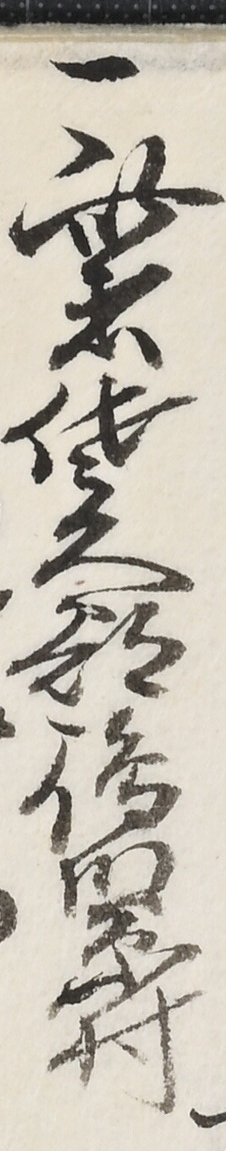一此者佐久郡島川原村
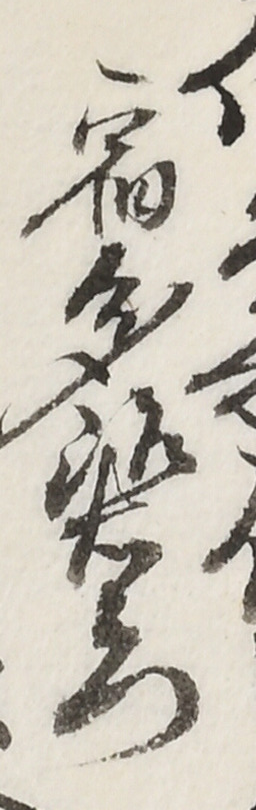宿多治右衛門
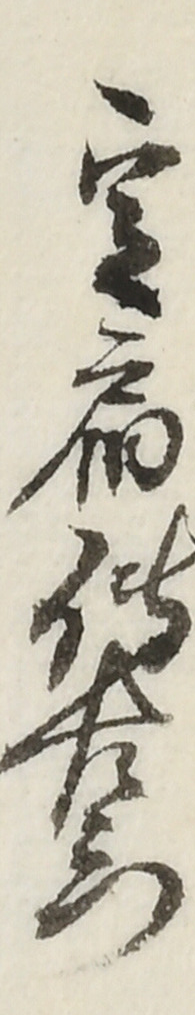定宿伝左衛門

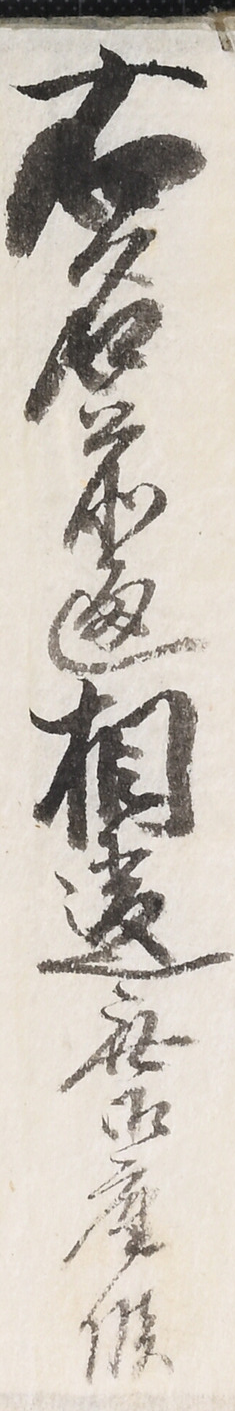右名前通相違無御座候
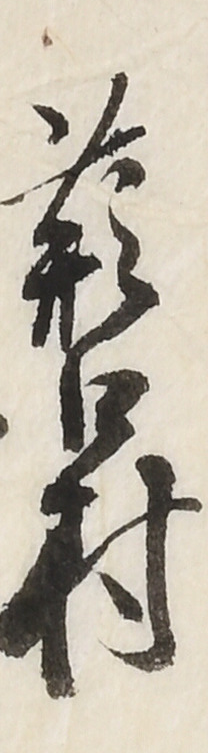荊口村
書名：慶應二丙寅年正月吉日他國出石切名前書上帳
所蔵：伊那市立高遠町図書館・合同会社AMANE
